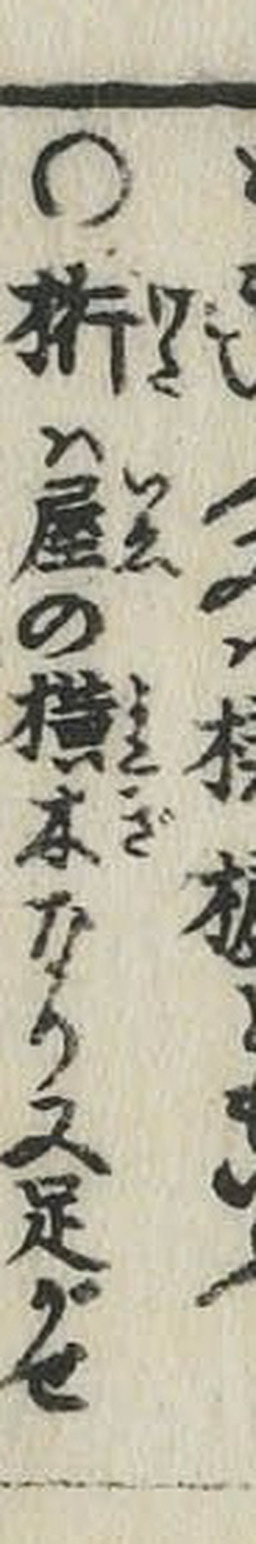○桁は屋の横木なり又足がせ

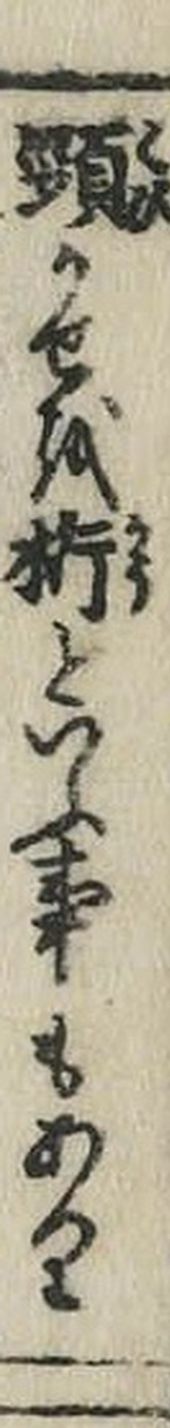頸かせを桁といふ事もあり
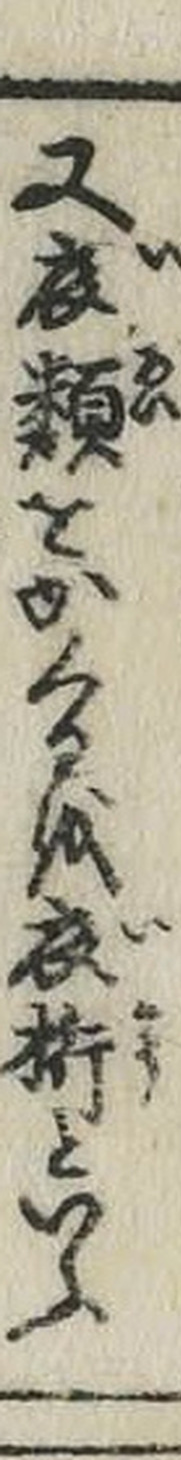又衣類をかくるを衣桁といふ
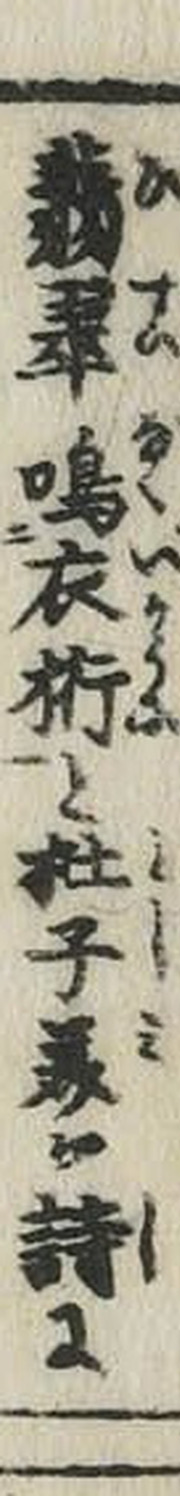翡翠鳴衣桁と杜子美が詩に
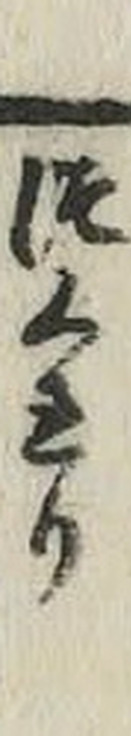つくれり
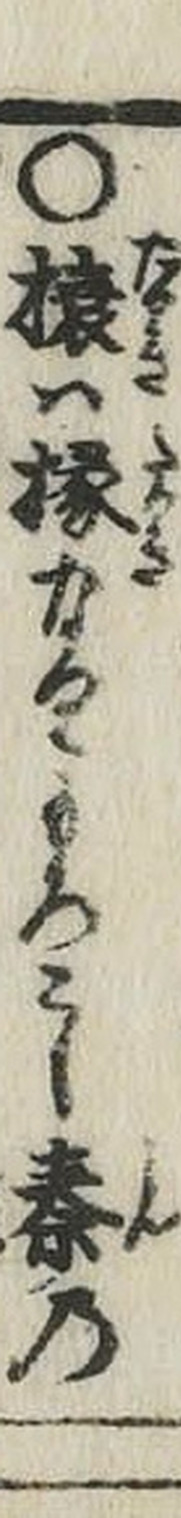○榱は椽なりもろこし秦の
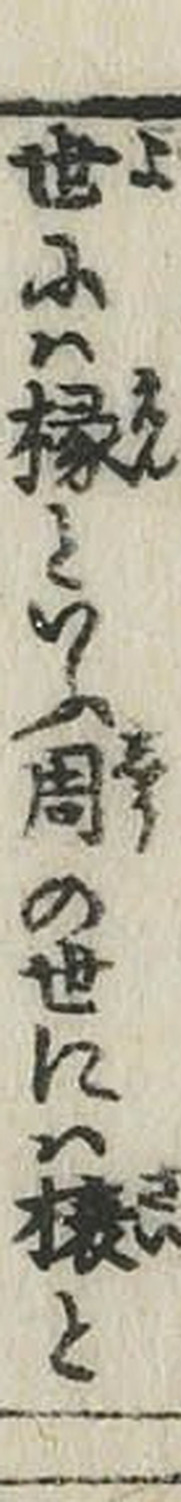世には椽といふ周の世には榱と
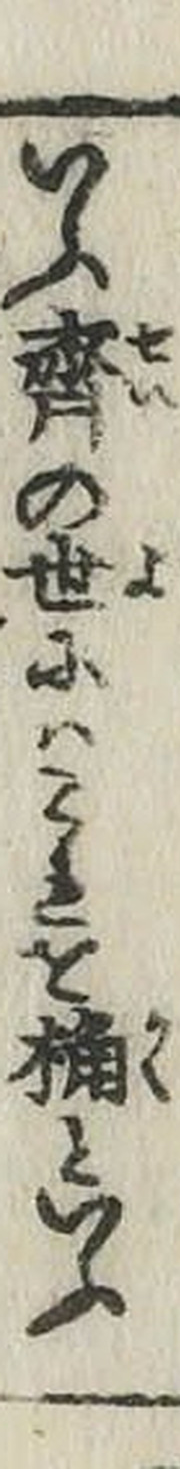いふ斉の世にはこれを桷といふ
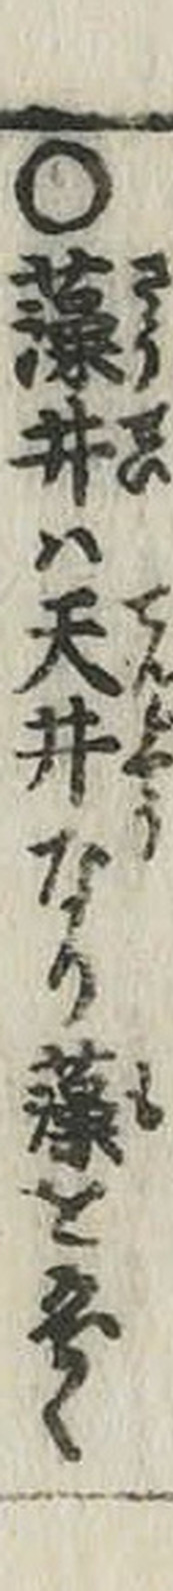○藻井は天井なり藻をゑかく
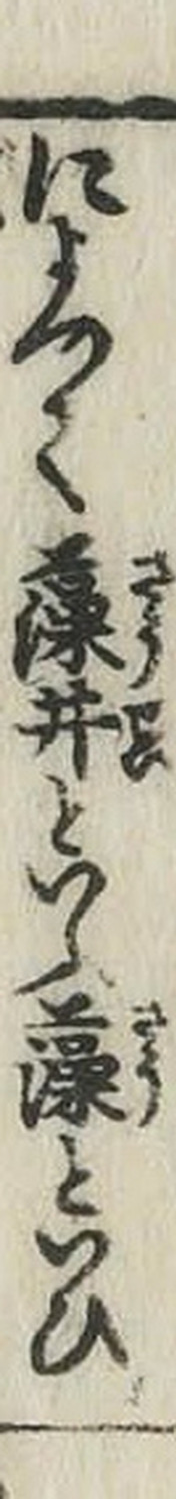によつて藻井といふ藻といひ
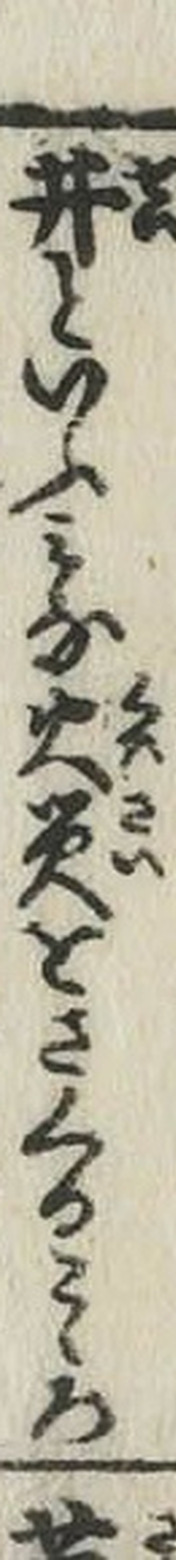井といふみな火災をさくるこゝろ
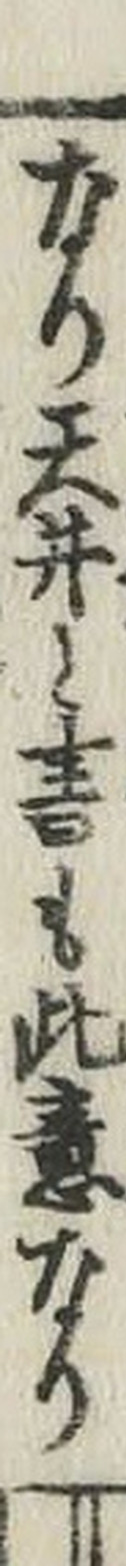なり天井と書も此意なり
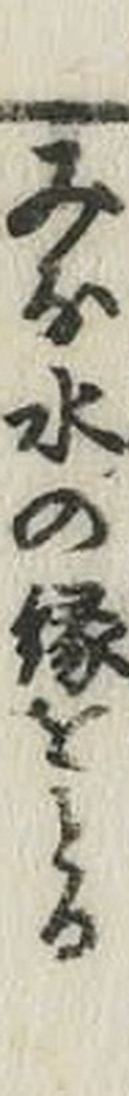みな水の縁をとる
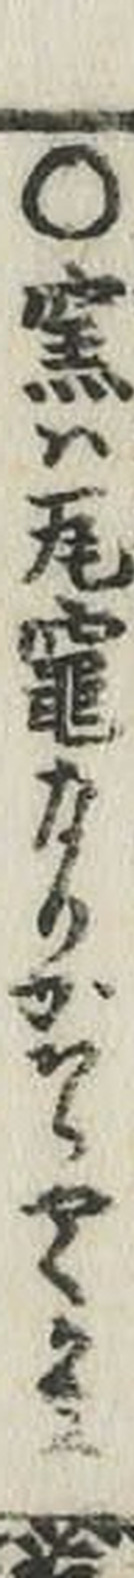○窯は瓦竃なりかはらやくかま
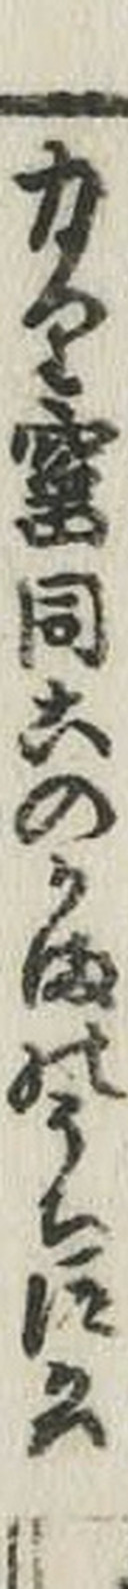なり窰同このかまのうちにかは
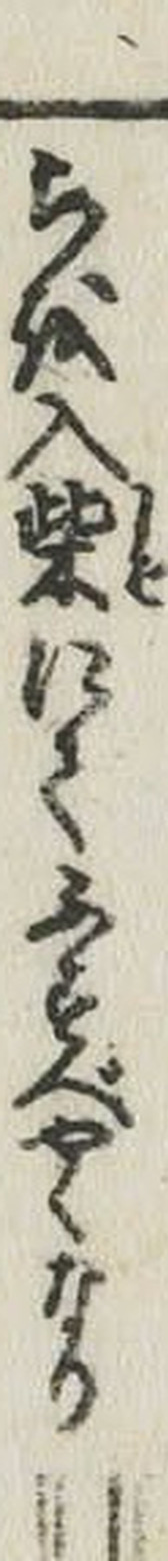らを入柴にてふすべやくなり
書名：増補頭書訓蒙図彙大成 10巻 2:巻之1-3
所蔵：東京学芸大学教育コンテンツアーカイブ
